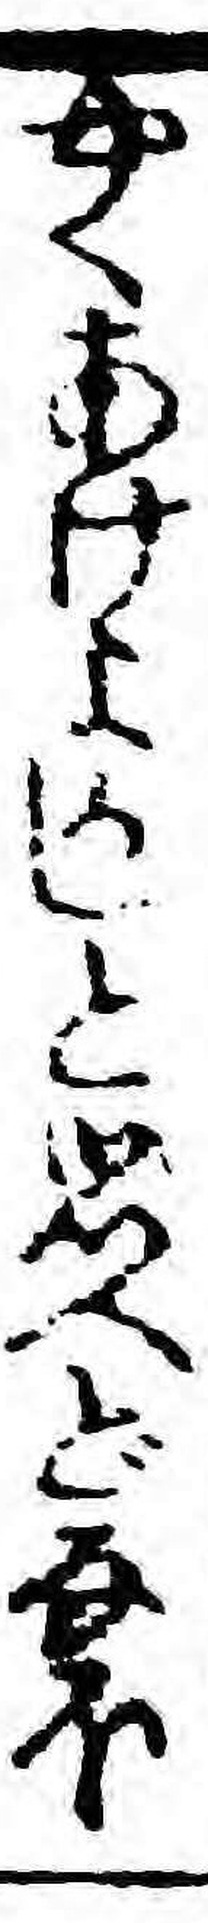やくあけよかしと思へどなほ
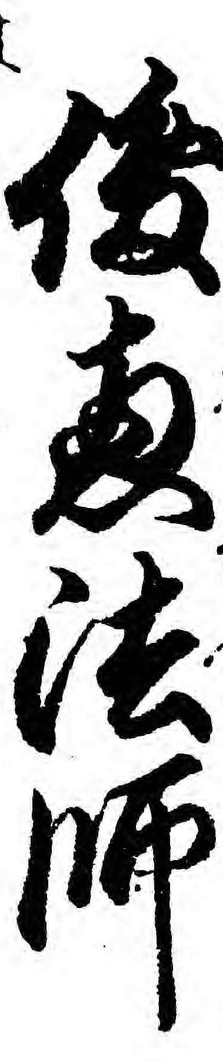俊惠法師
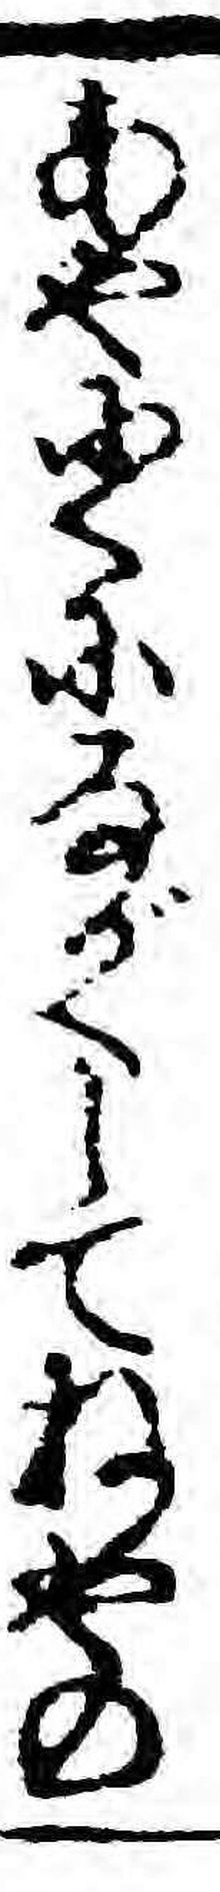あやにくにながくしてねやの
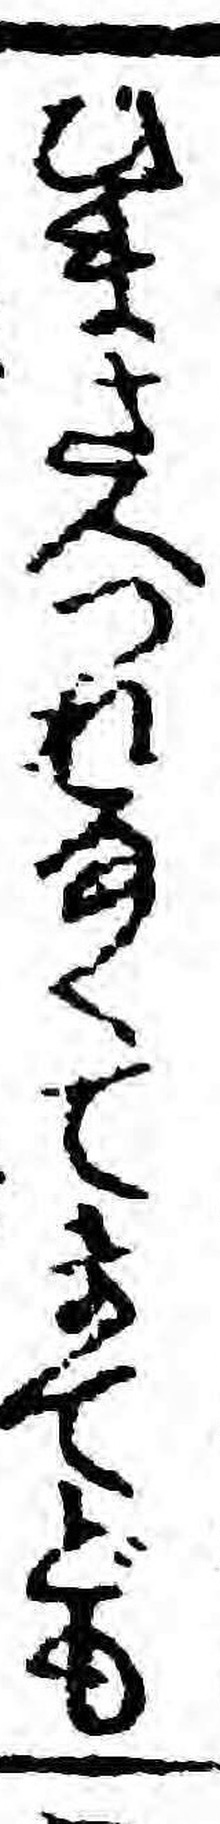ひまさへつれなくてまてども
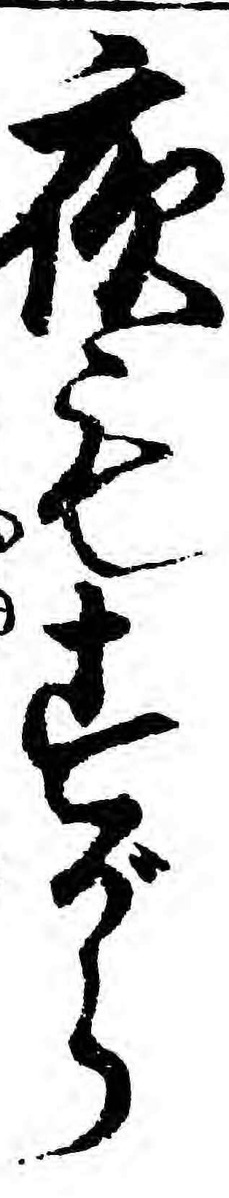夜もすがら
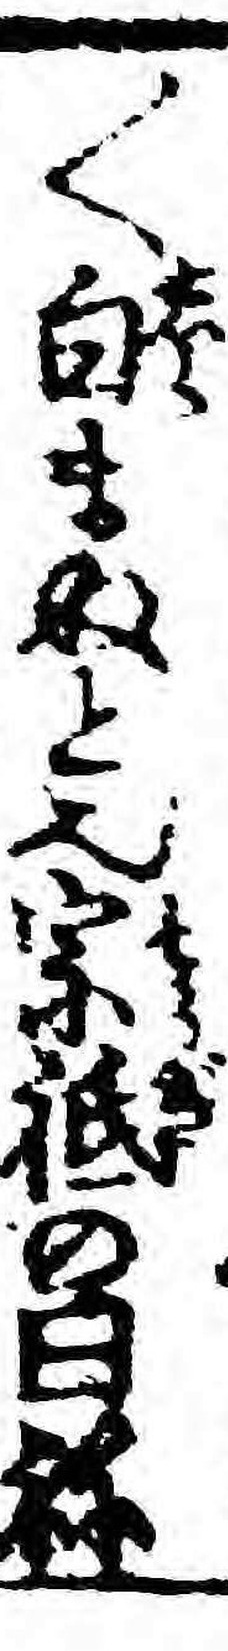〳〵白まぬと也宗祇の曰ね
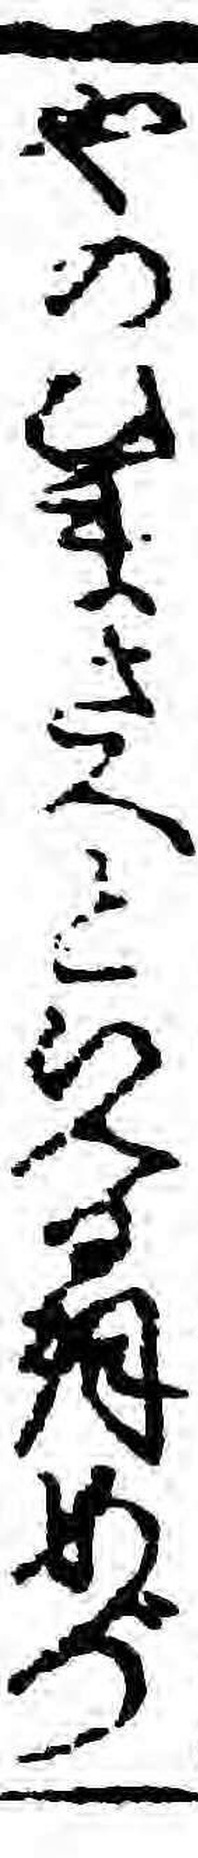やのひまさへといへる詞めづ
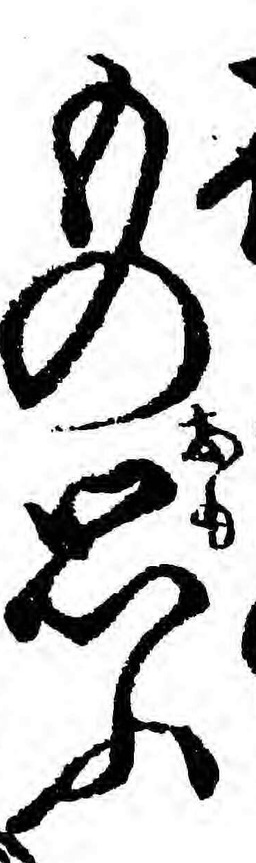もの思ふ
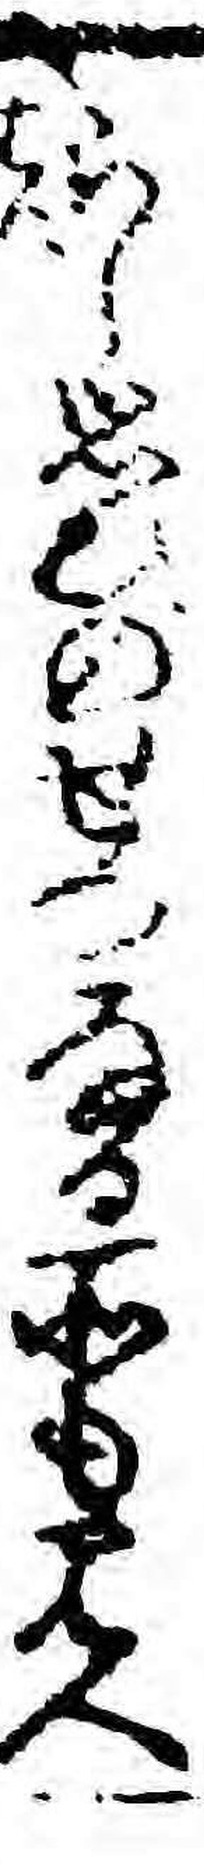らし思ひのせつなる所も見へ
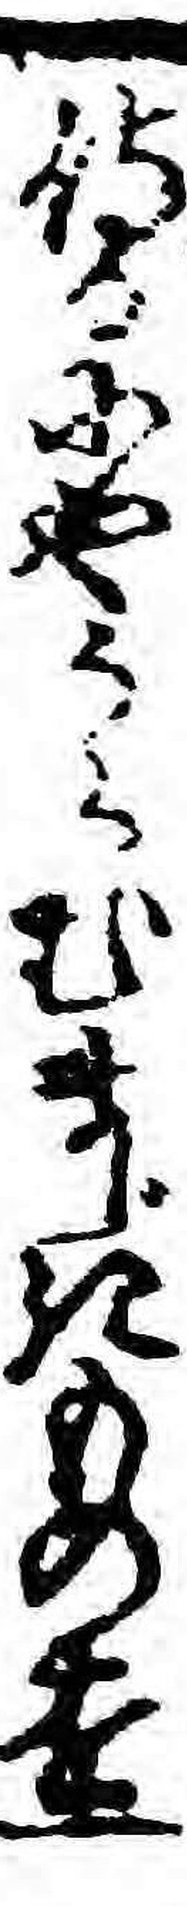侍るにやうらむまじきものを
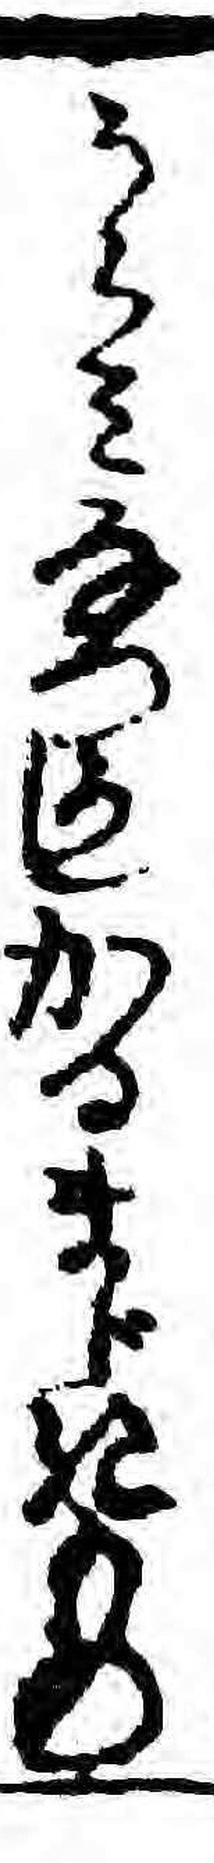うらみなつかしかるまじきもの
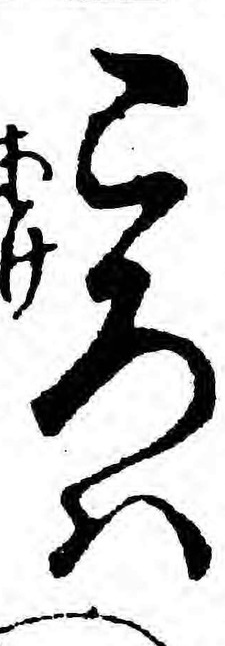ころは
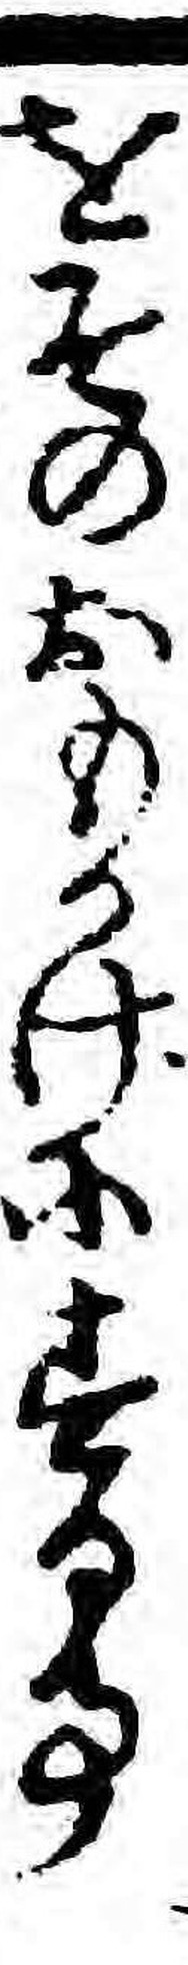をそのおもかげにする事
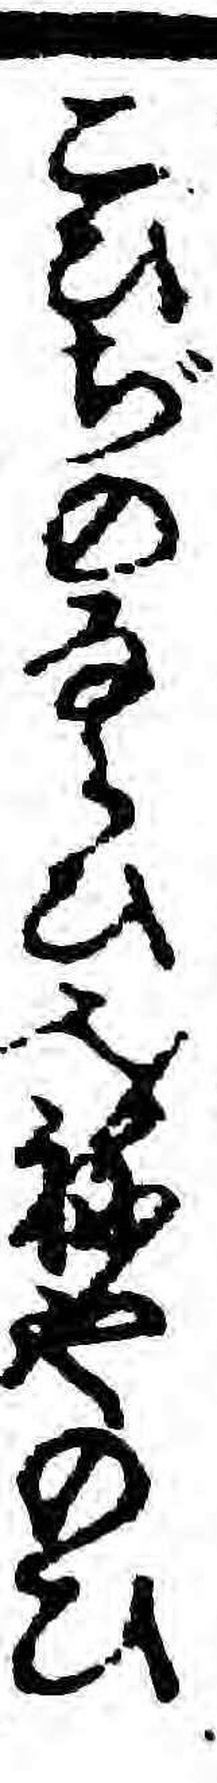こひぢのならひ也ねやのひ
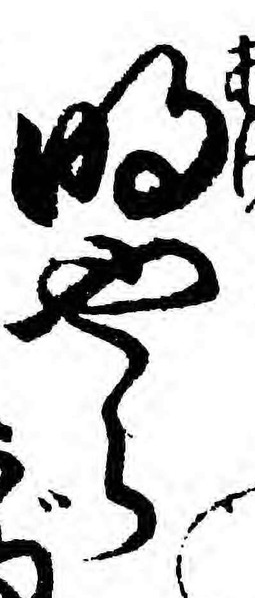明やら
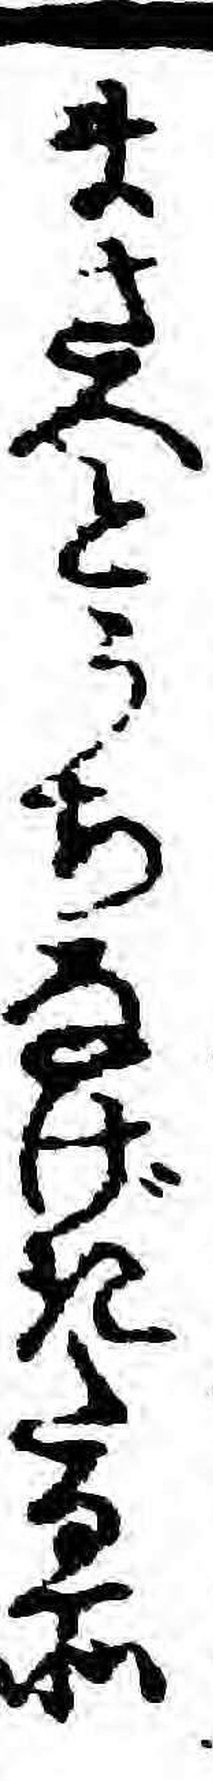まさへとうちなげきたる所
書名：頭書和歌注譯／壽賀多百人一首小倉錦
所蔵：国文学研究資料館
